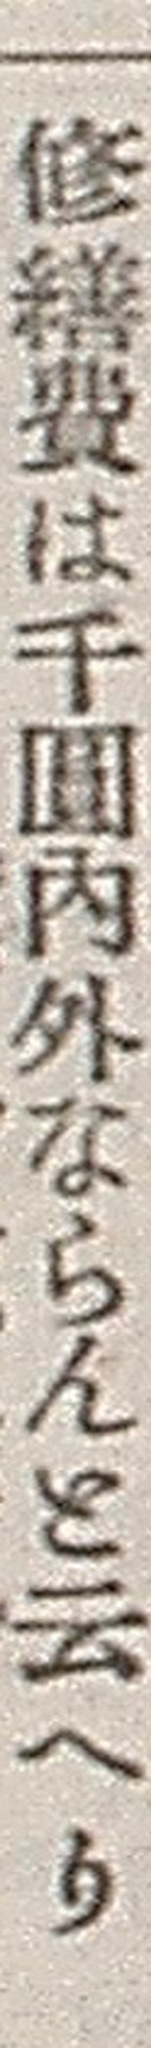修繕費は千円内外ならんと云へり
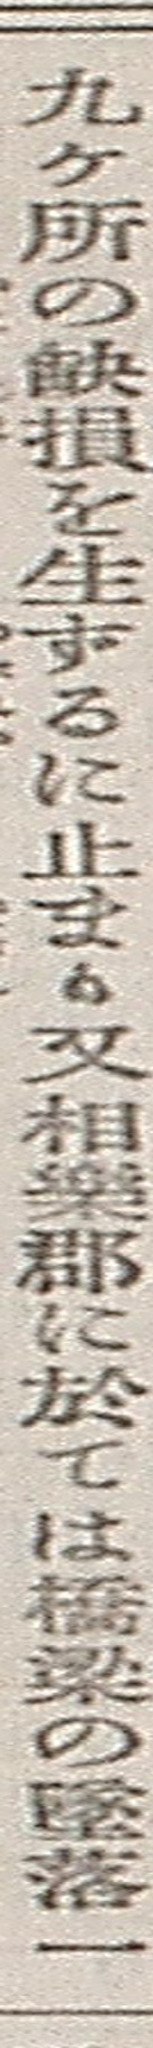九ヶ所の缺損を生ずるに止まり又相楽郡に於ては橋梁の墜落一
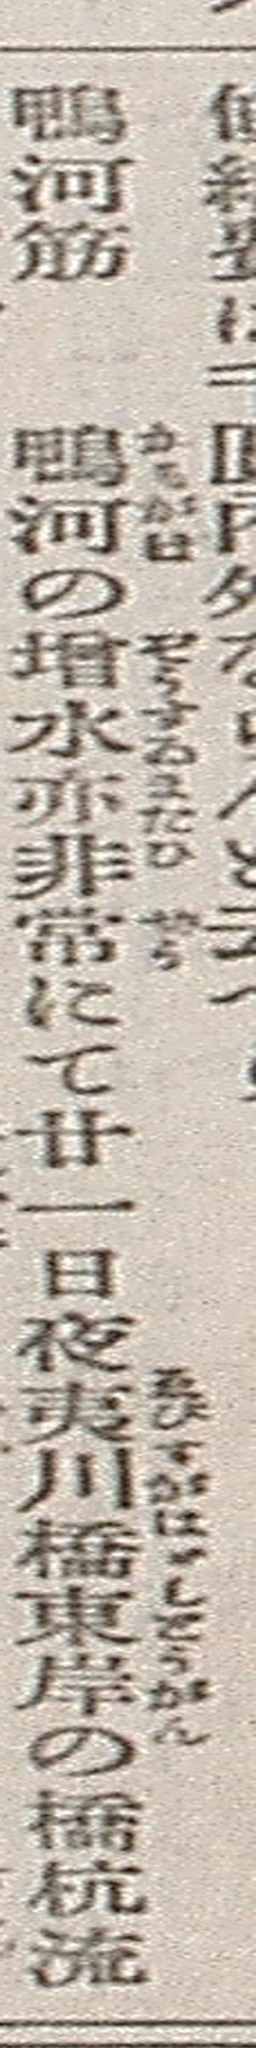鴨河筋鴨河の増水亦非常にて廿一日夜夷川橋東岸の橋杭流
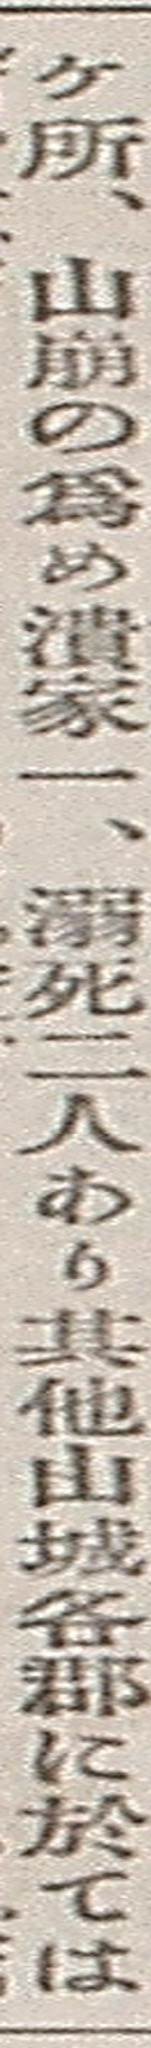ヶ所、山崩の為め潰家一、溺死二人あり其他山城各郡に於ては
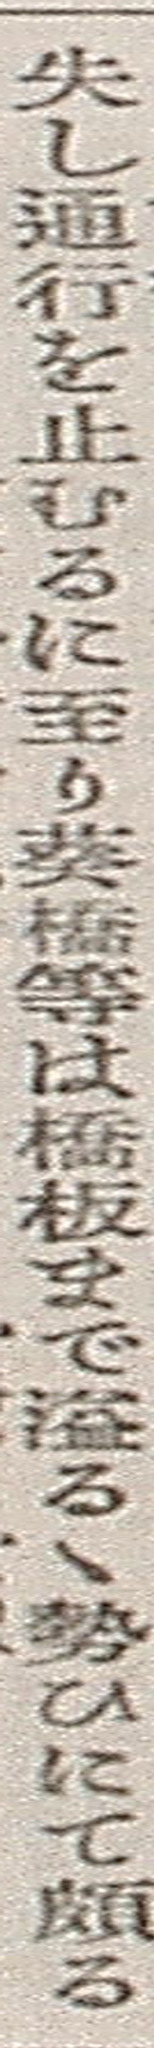失し通行を止むるに至り葵橋等は橋板まで溢るゝ勢ひにて頗る
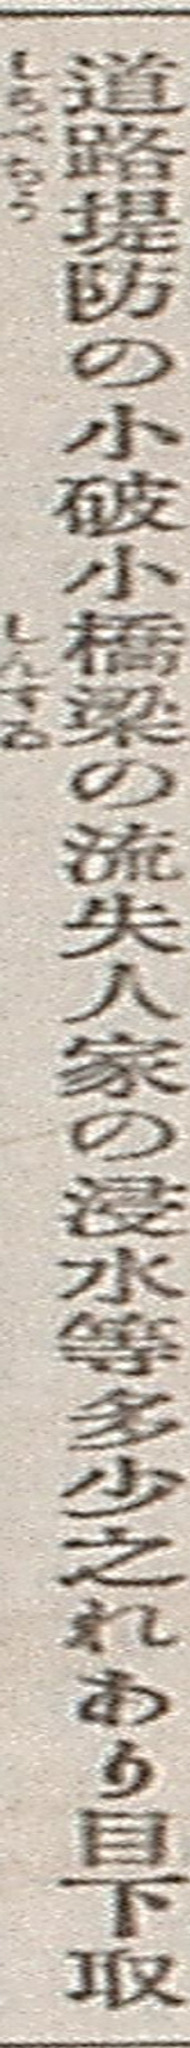道路堤防の小破小橋梁の流失人家の浸水等多少之れあり目下取
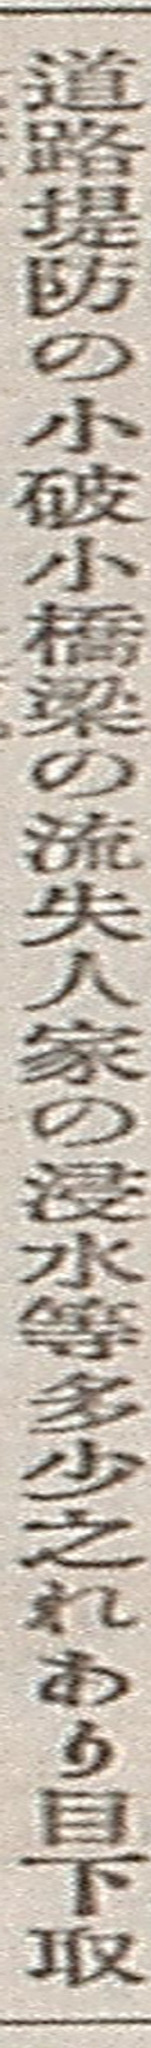道路堤防の小破小橋梁の流失人家の浸水等多少之れあり目下取
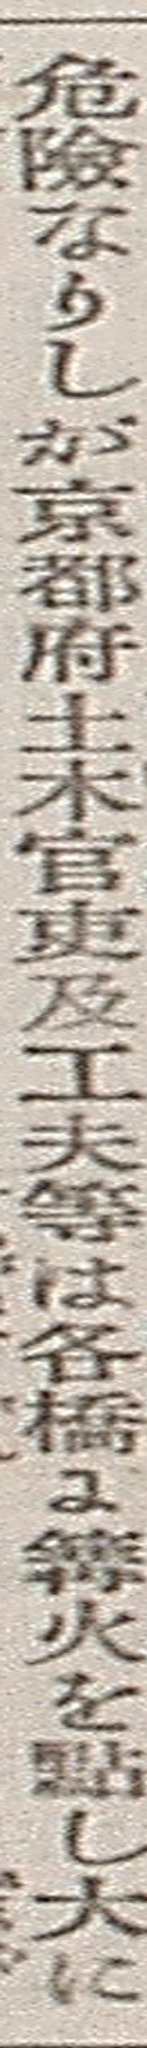危険なりしが京都府土木官吏及工夫等は各橋に篝火を点し大に
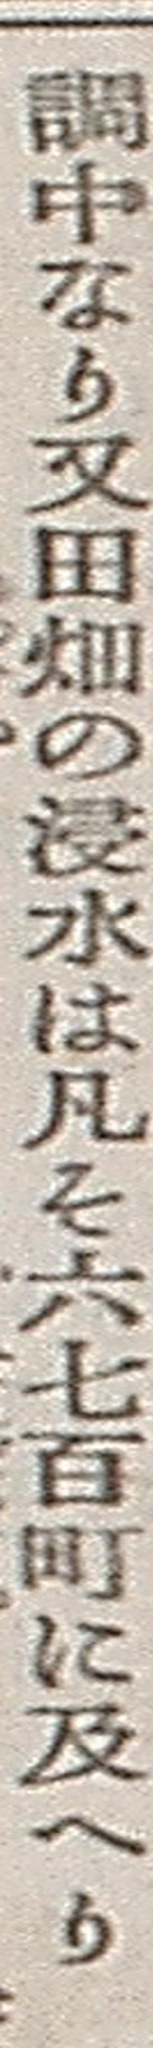調中なり又田畑の浸水は凡そ六七百町に及べり
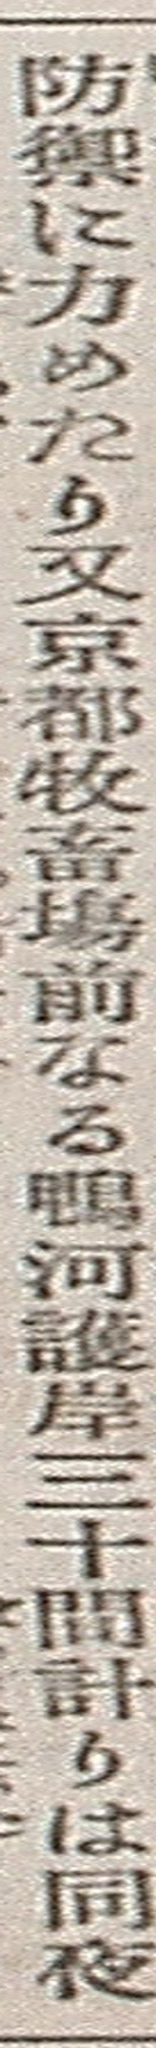防禦に力めたり又京都牧畜場前なる鴨河護岸三十間計りは同夜
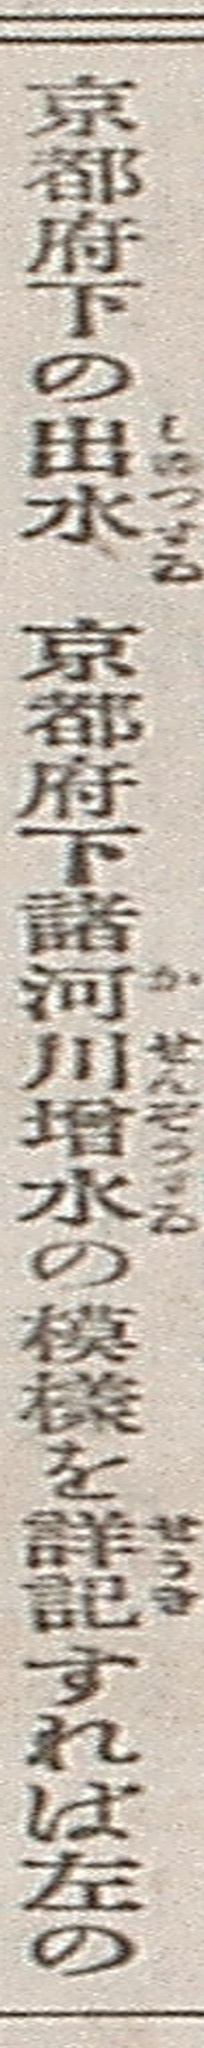京都府下の出水京都府下諸河川増水の模様を詳記すれば左の
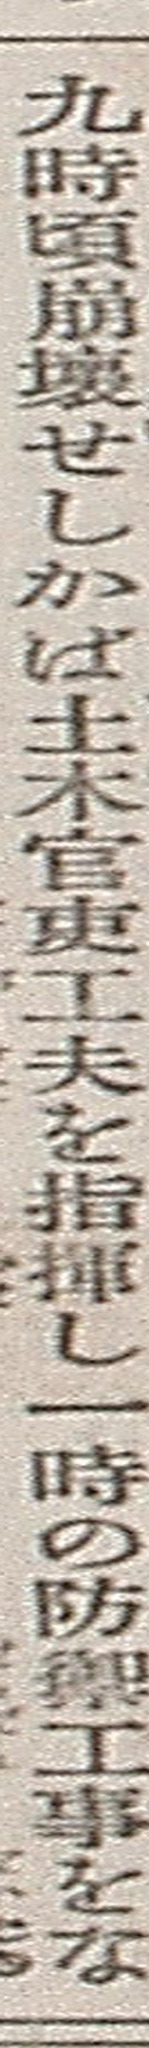九時頃崩壊せしかば土木官吏工夫を指揮し一時の防禦工事をな
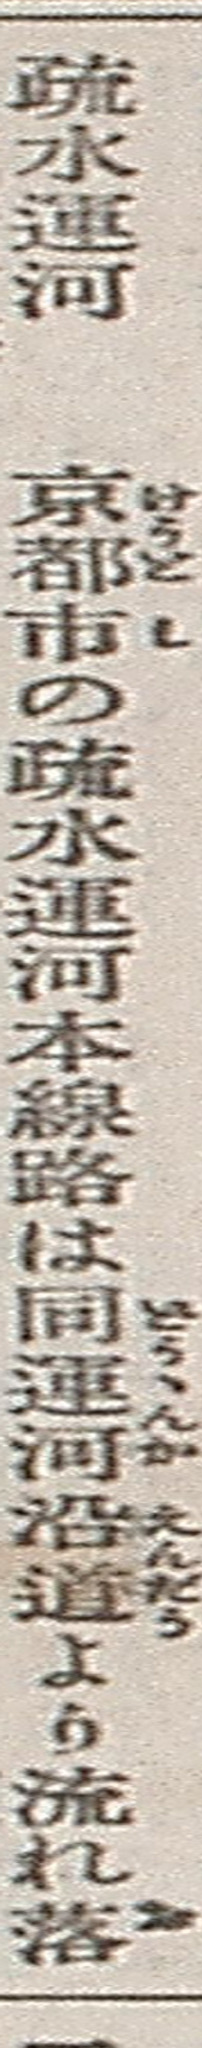疎水運河京都市の疎水運河本線路は同運河沿道より流れ落
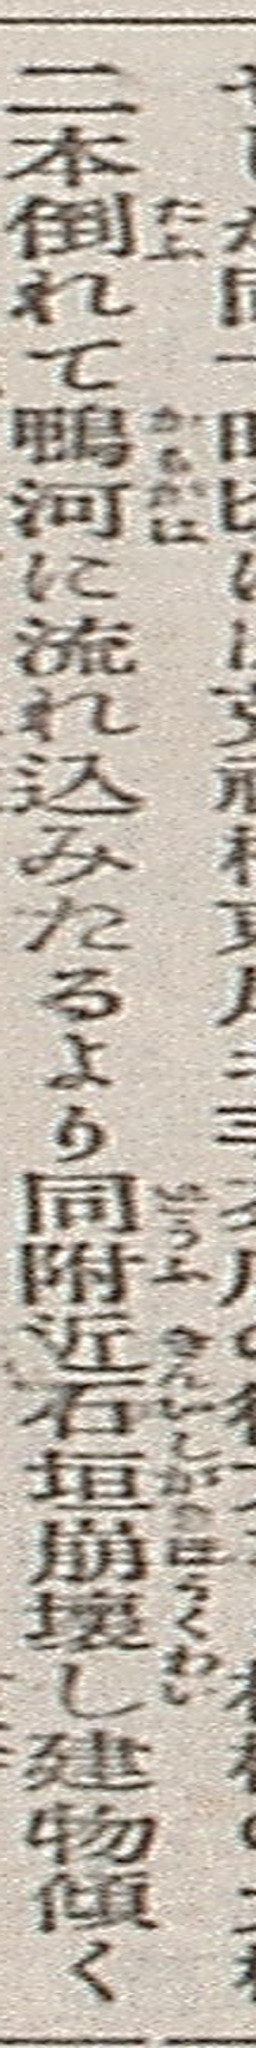二本倒れて鴨河に流れ込みたるより同附近石垣崩壊し建物傾く
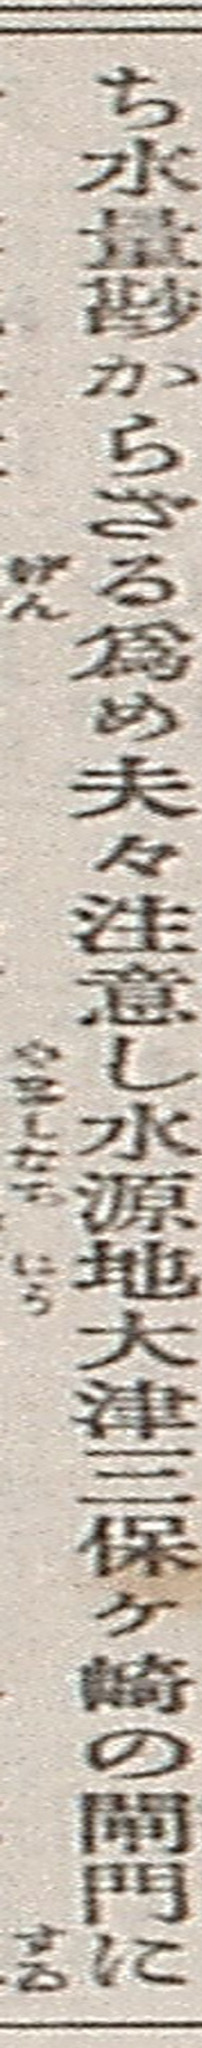ち水量尠からざる為め夫々注意し水源地大津三保ヶ崎の閘門に
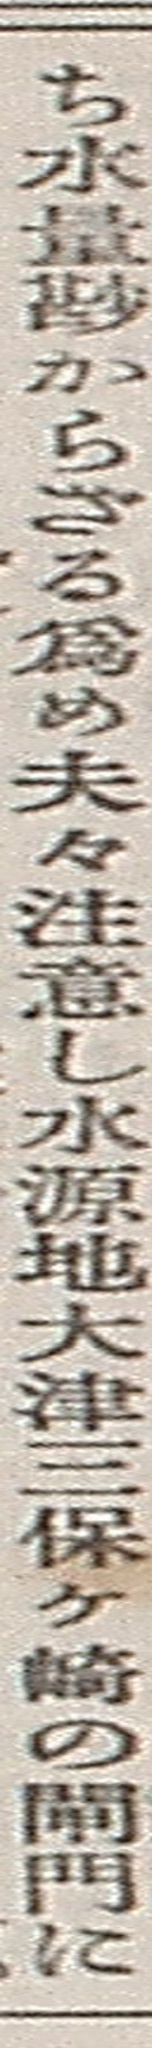ち水量尠からざる為め夫々注意し水源地大津三保ヶ崎の閘門に
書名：風俗畫報臨時増刊第百二十八號　洪水被害録（下）
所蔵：東京大学地震研究所図書室 Earthquake Research Institute Library, The University of Tokyo, JAPAN
